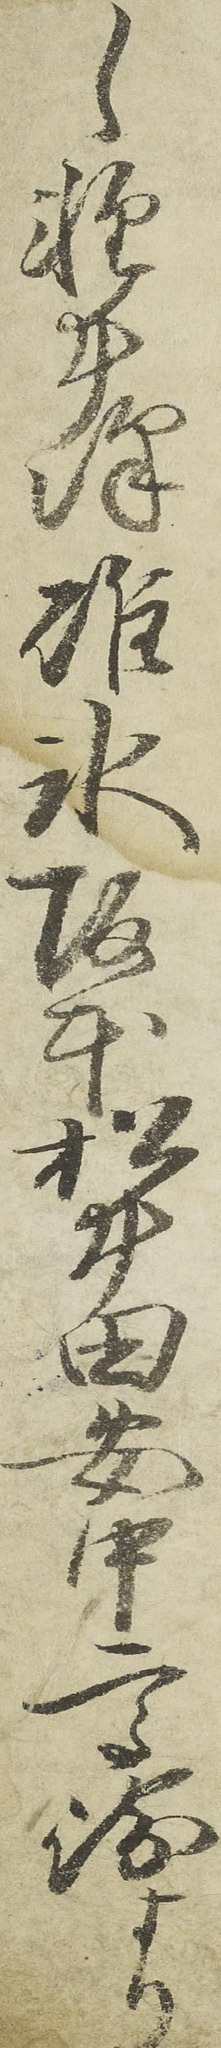く軽井沢碓氷坂本松本田安中高崎より

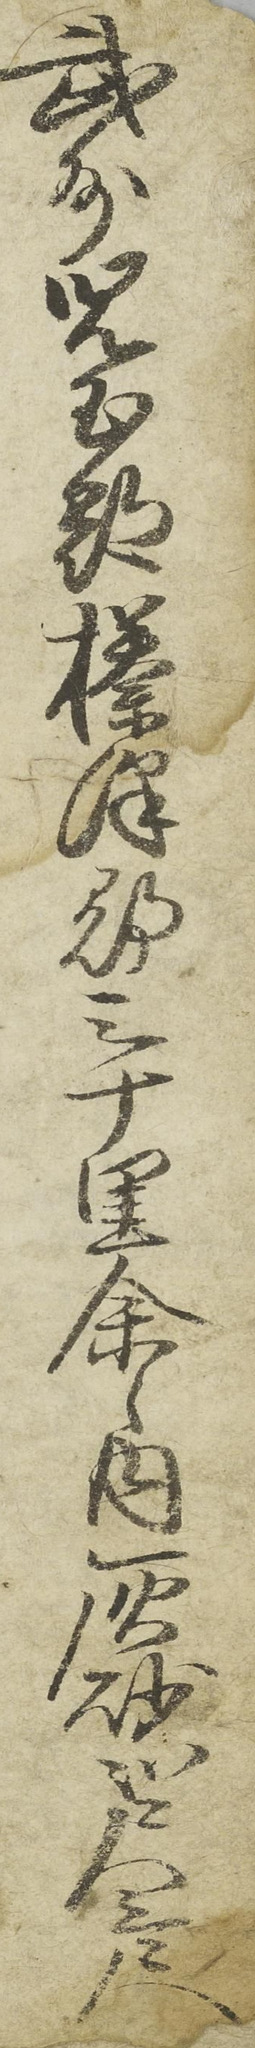武州児玉郡榛澤群三十里余之内灰砂弐尺三尺
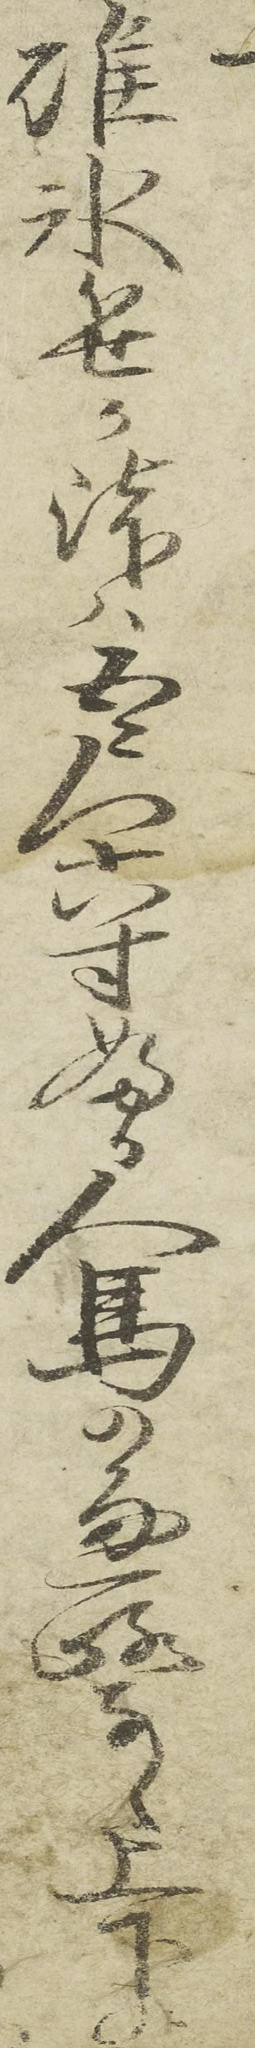碓氷笹か峠ハ五尺六寸ふる人馬の通路なく上下の
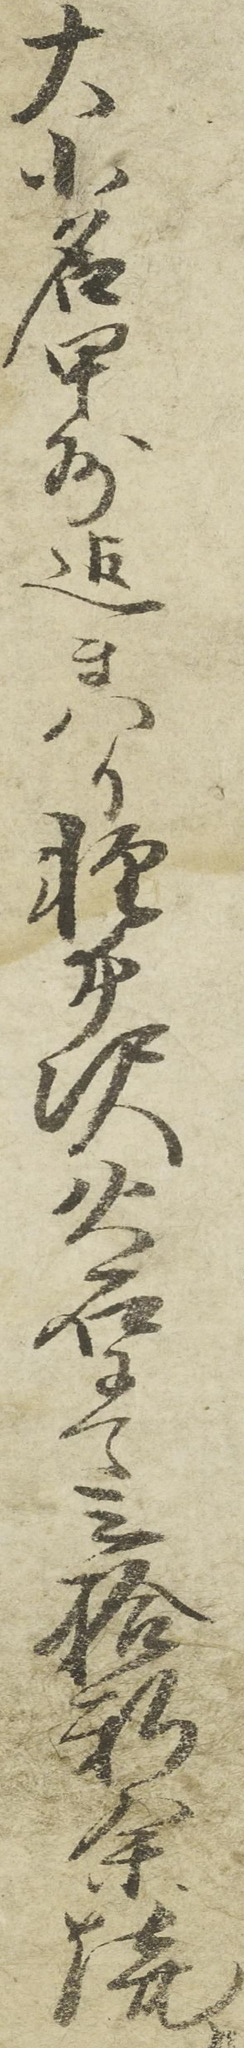大小名甲州迄まハり軽井沢火石にて三拾軒余焼ル
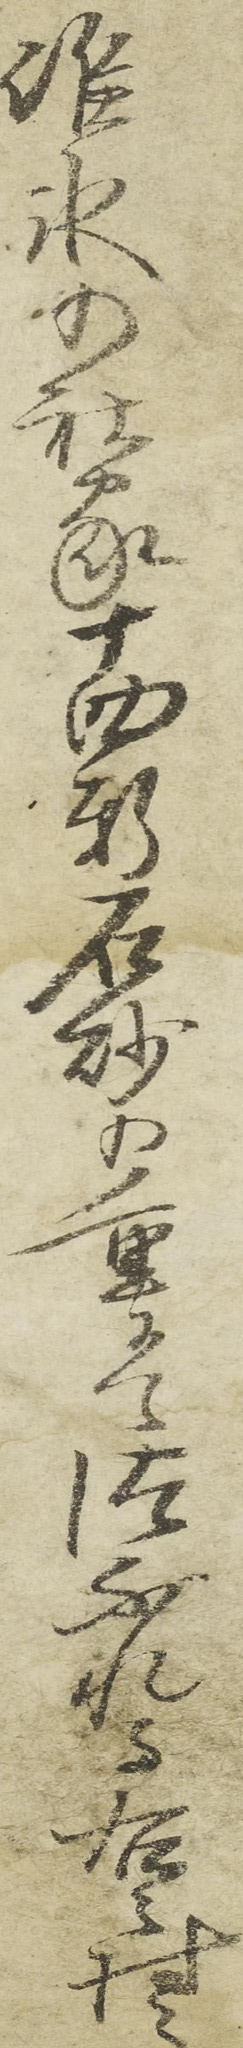碓氷の社家十四軒石砂の重にてつぶれる右の村々
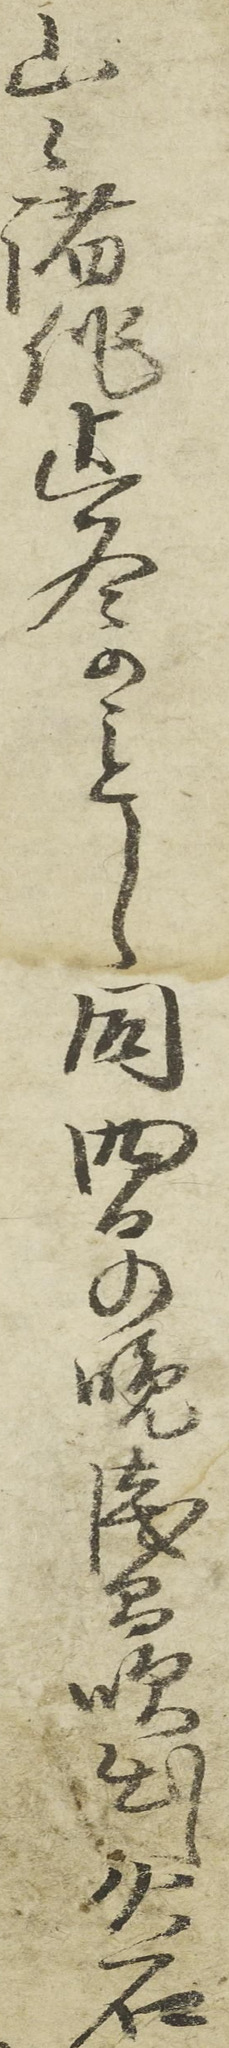山々諸作迄冬のことし同四日の晩浅間吹出し火石
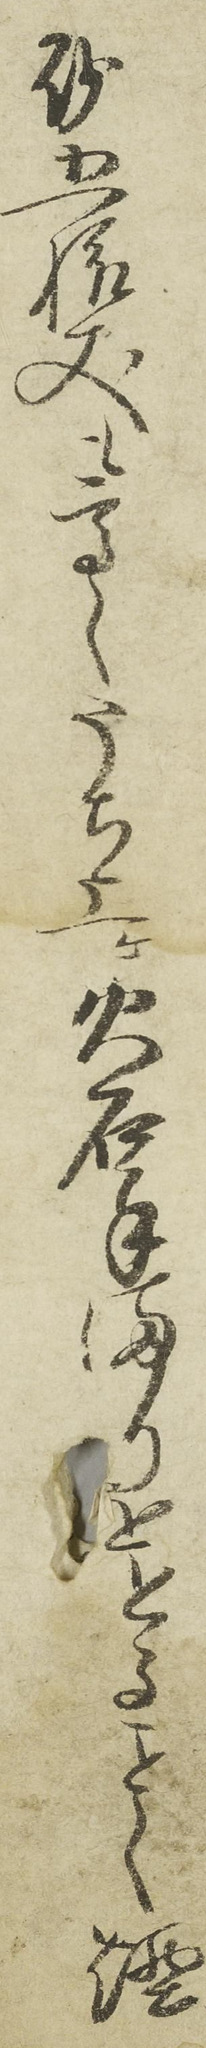砂五拾丈も高くうち上ケ火石手まりをとることく煙り
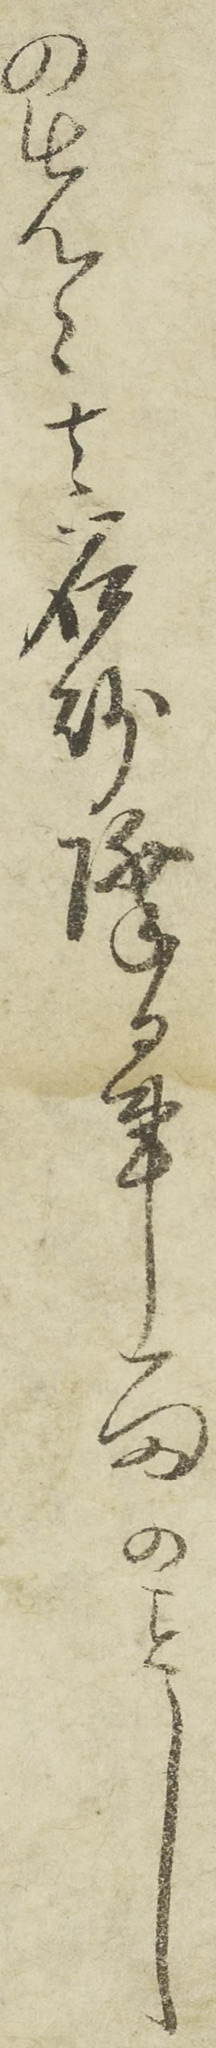の先々真石砂降る事雨のことし
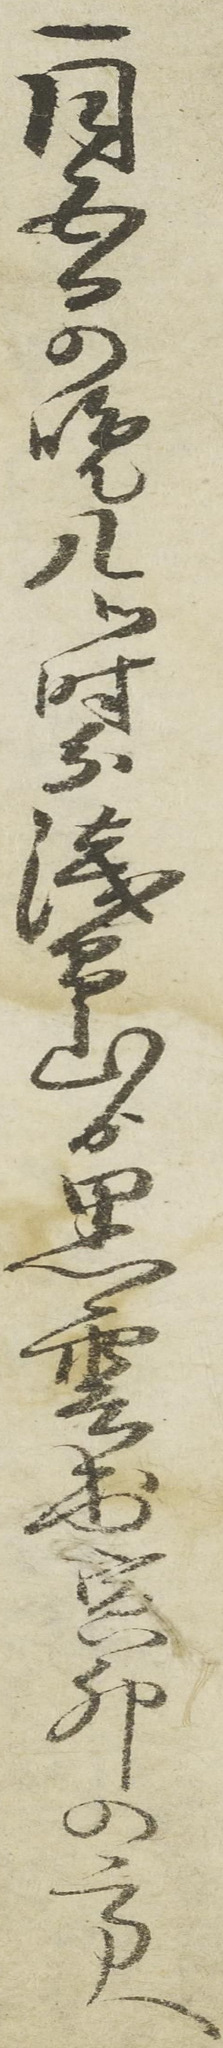一月五日の晩八ツ時分浅間山ゟ黒雲出寅卯の方へ
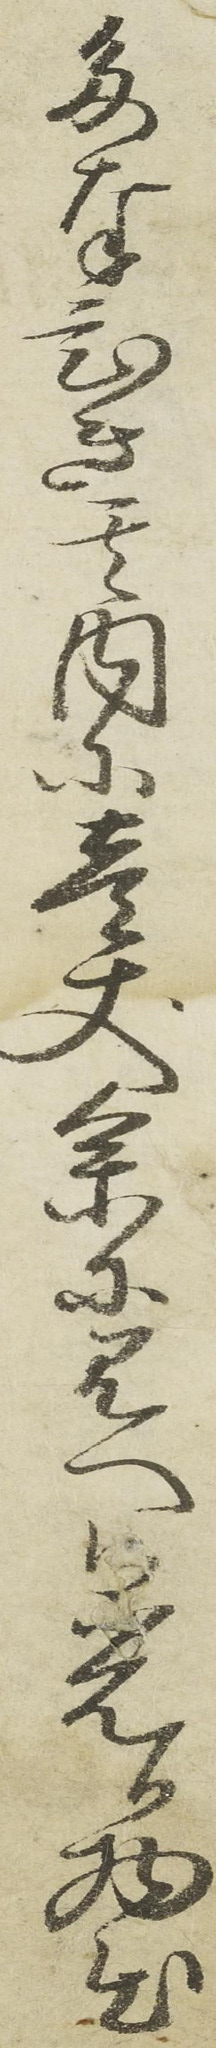たなひき其内に壱条余に見へり光り物出
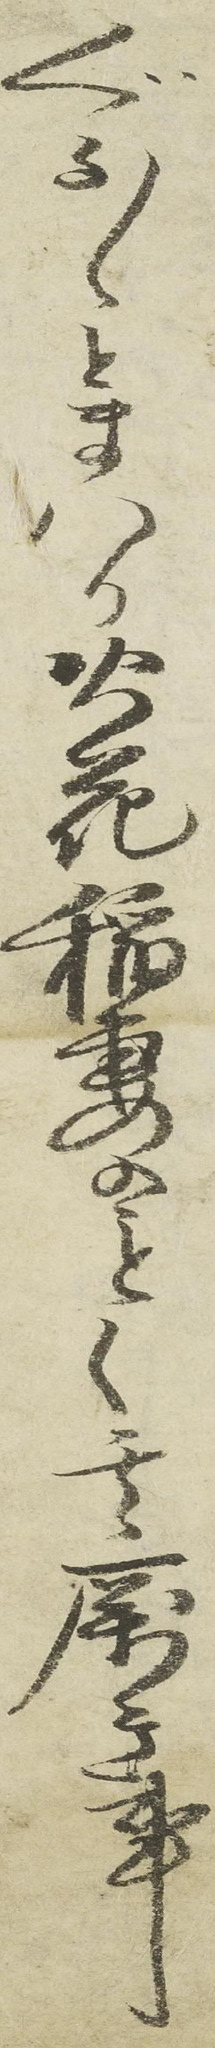ぐる〳〵とまハり火花稲妻のことく其厲き事
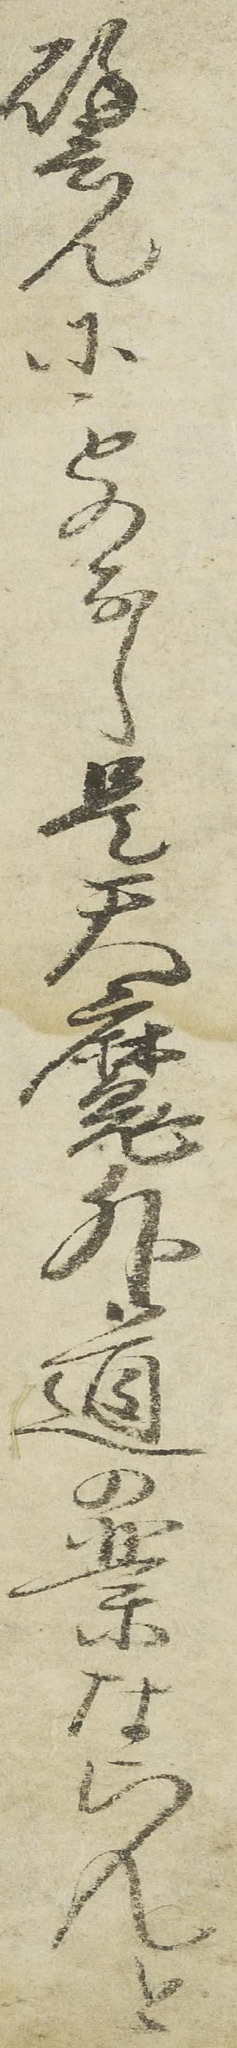譬んにものなし是天魔外道の業ならんと
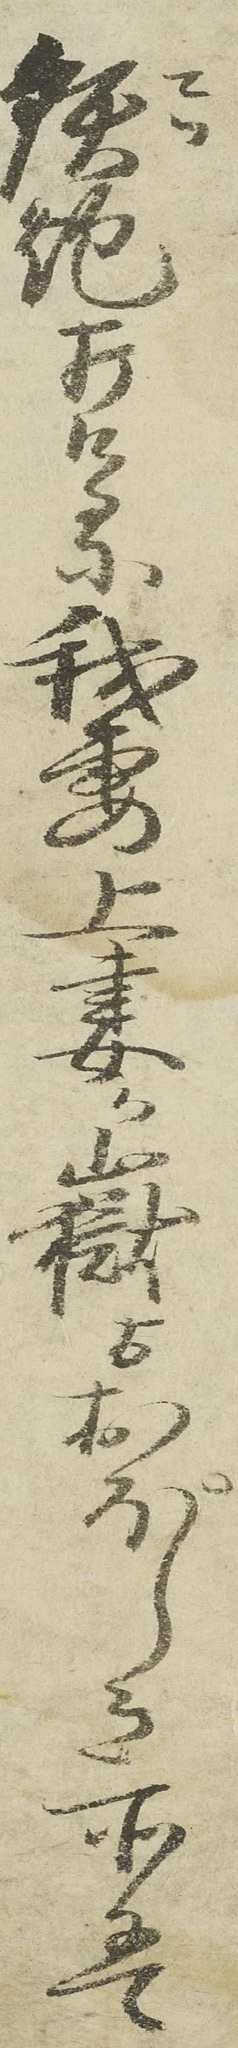鉄炮打けるに我妻上妻か嶽とおほしき所にて
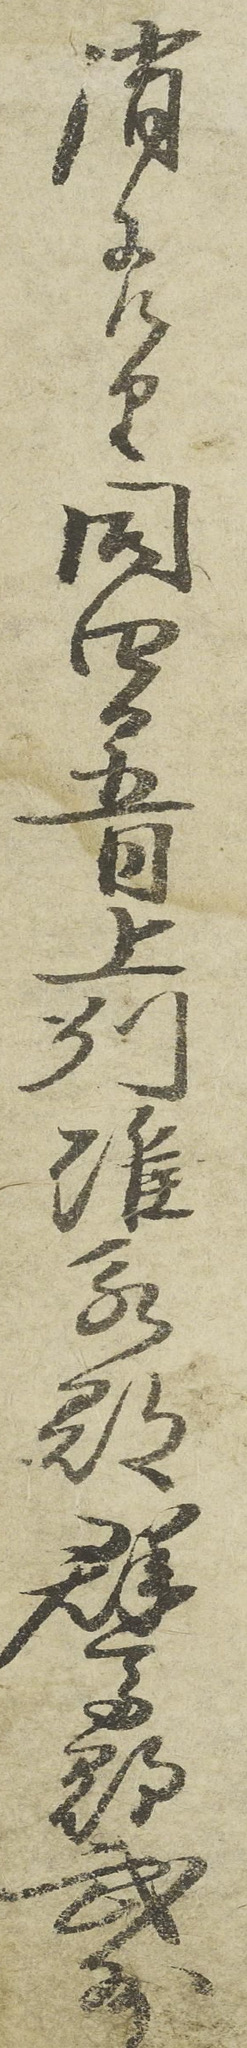消にけり同四日五日上州碓氷郡群馬郡武州

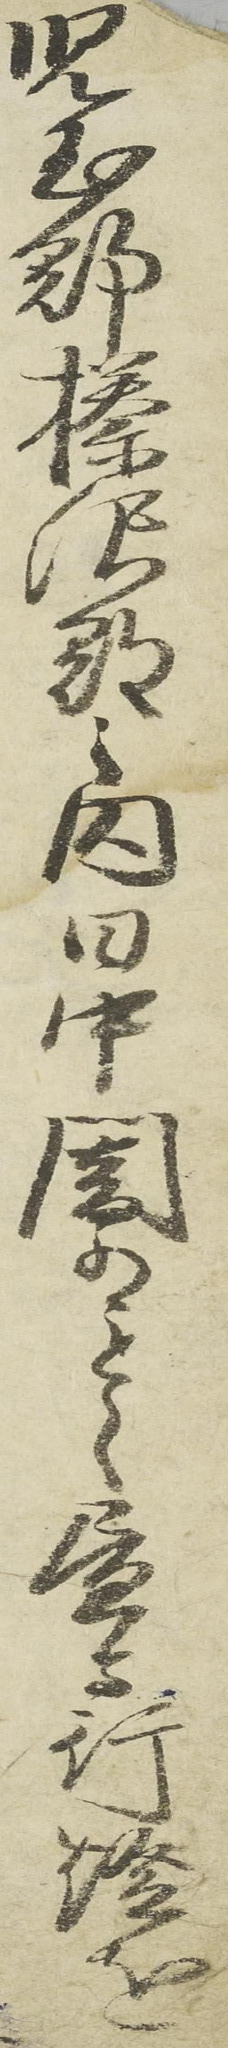児玉郡榛沢郡の内日中闇のことく昼に行燈を
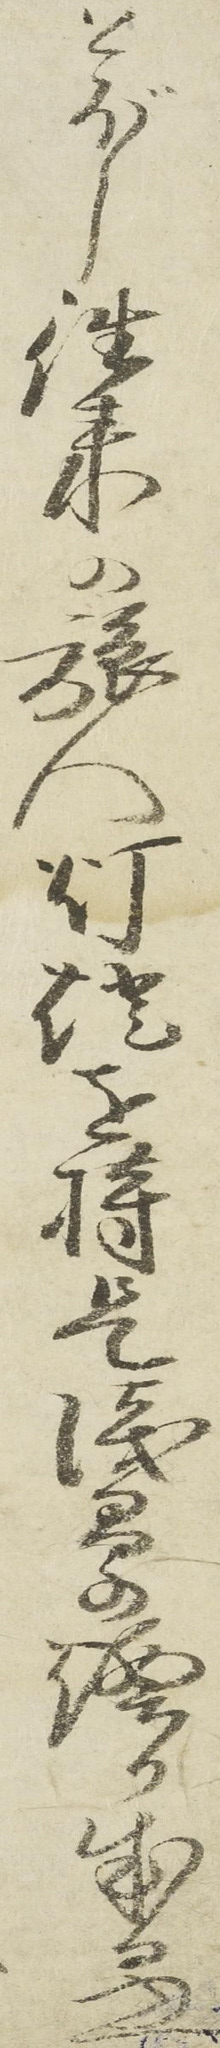とぼし往来の旅人提灯を持是浅間の煙り成るゆへ
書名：浅間大変略記
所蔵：東京大学地震研究所図書室 Earthquake Research Institute Library, The University of Tokyo, JAPAN
